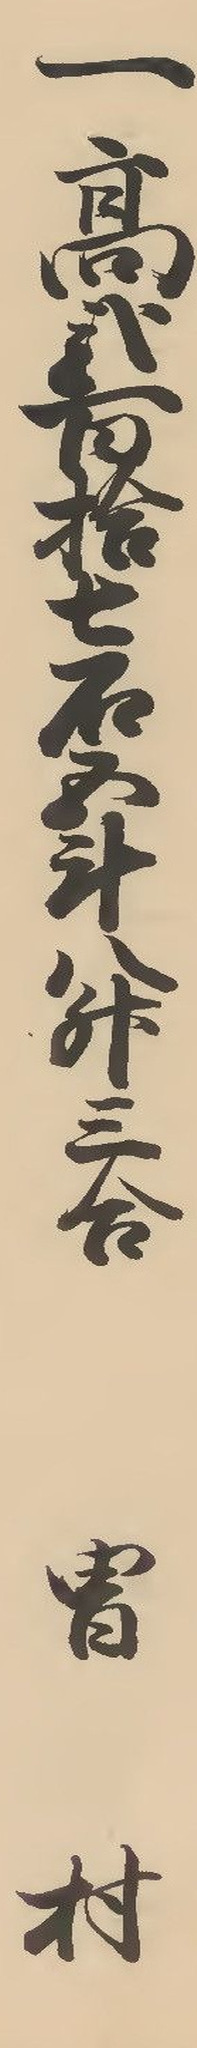一高弐百拾七石五斗八升三合胄村
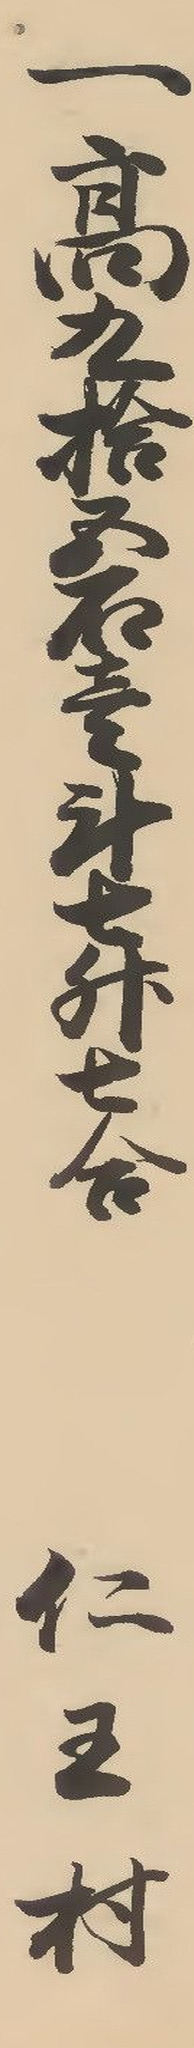一高九拾五石壱斗七升七合仁王村
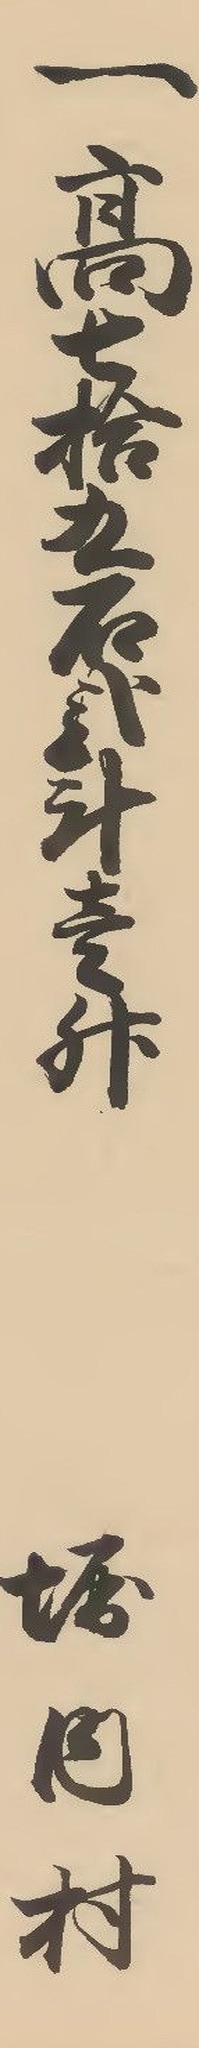一高七拾九石弐斗壱升堀内村
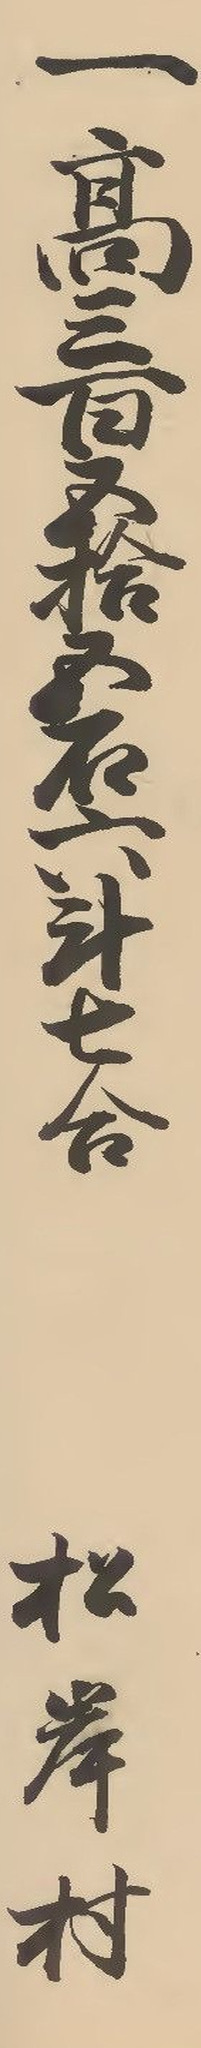一高三百五拾五石六斗七合松岸村
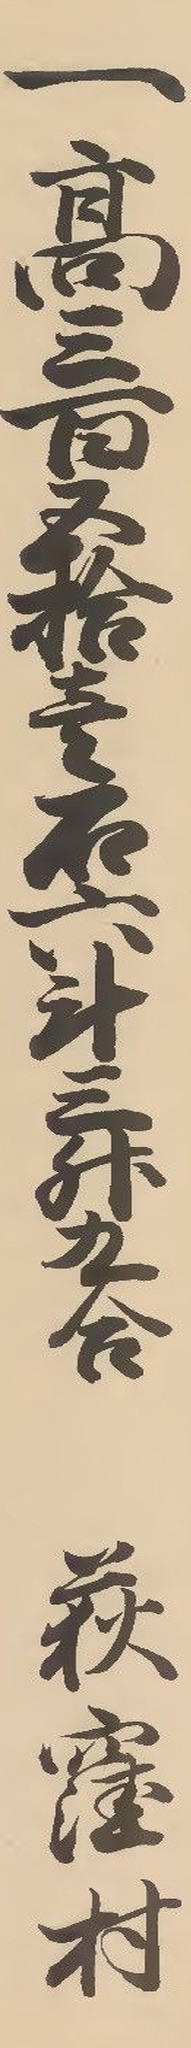一高三百五拾壱石六斗三升九合荻窪村
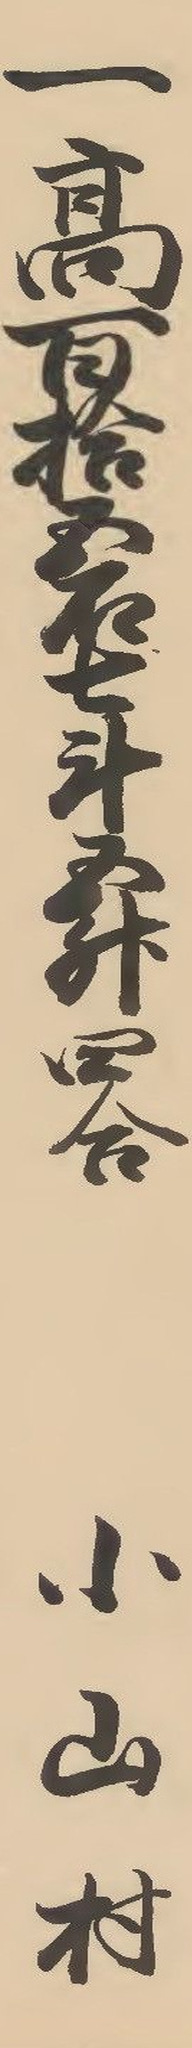一高百拾五石七斗五升四合小山村
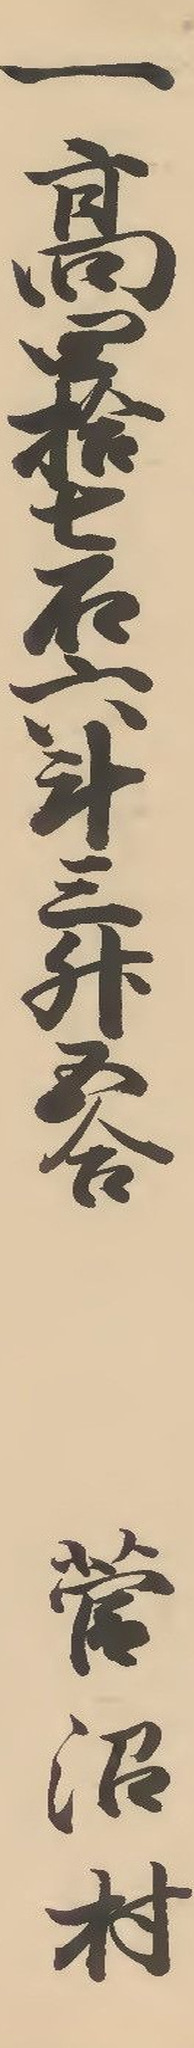一高四拾七石六斗三升五合菅沼村
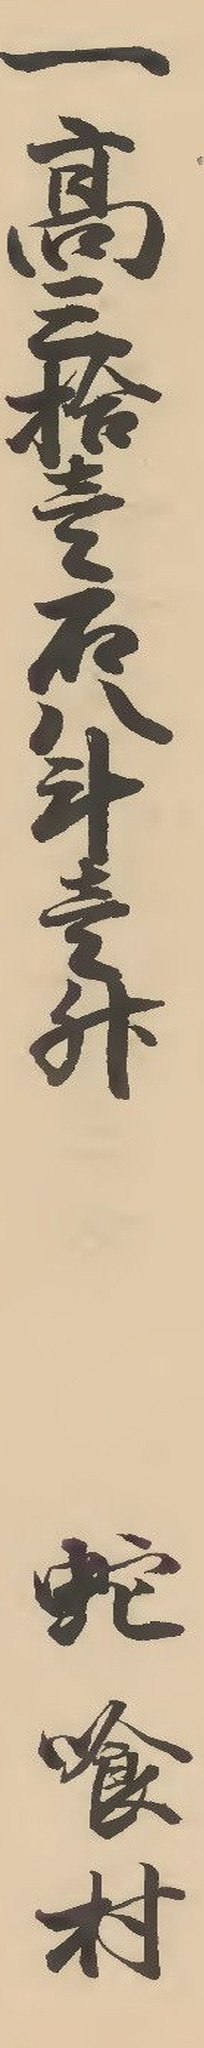一高三拾壱石八斗壱升蛇喰村

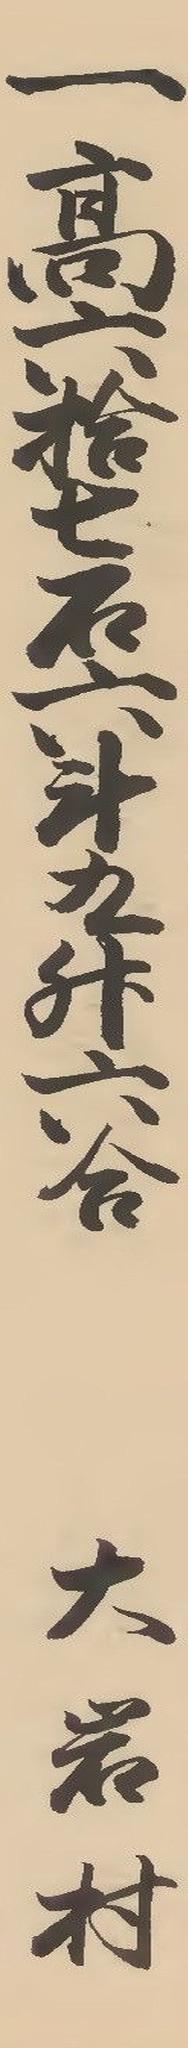一高六拾七石六斗九升六合大岩村
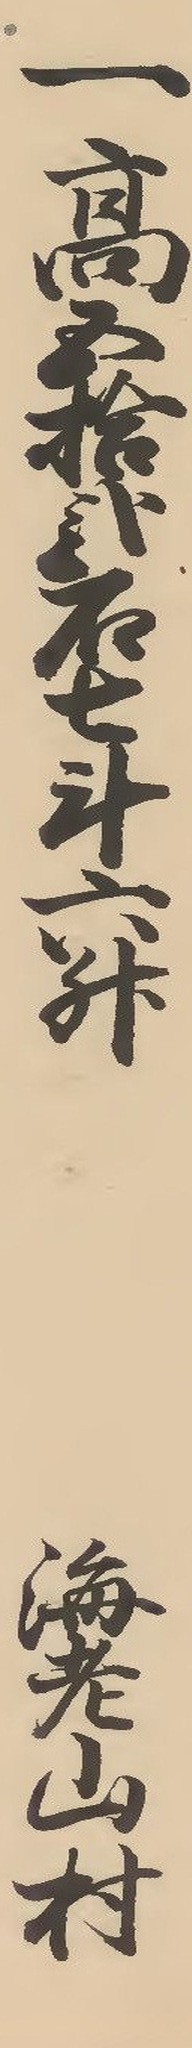一高五拾弐石七斗六升海老山村
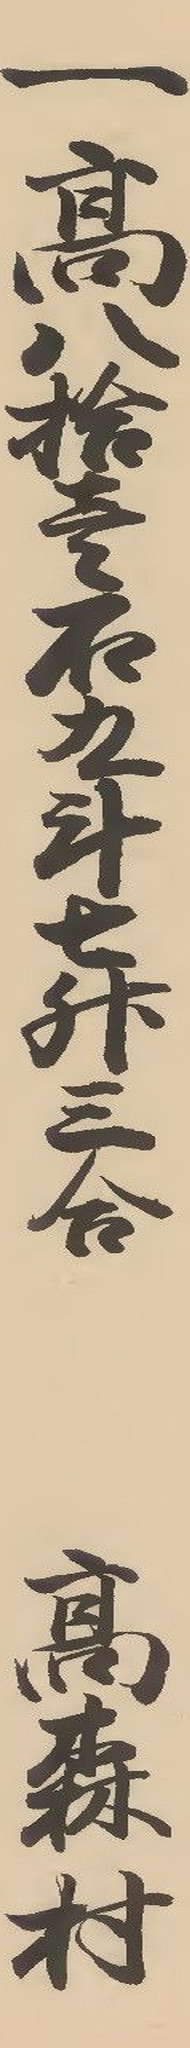一高八拾壱石九斗七升三合高森村
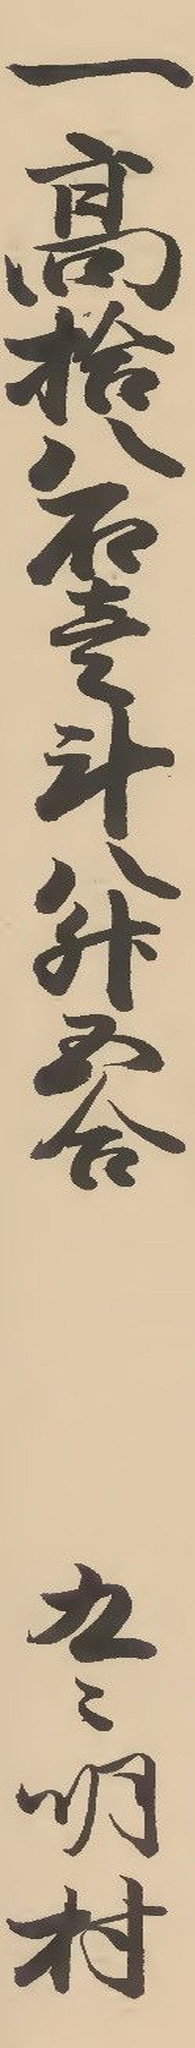一高拾八石壱斗八升五合九々明村
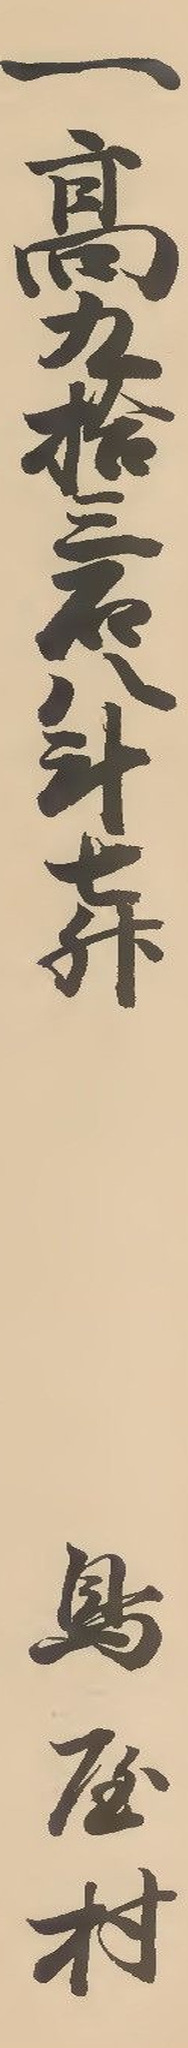一高九拾三石八斗七升鳥屋村
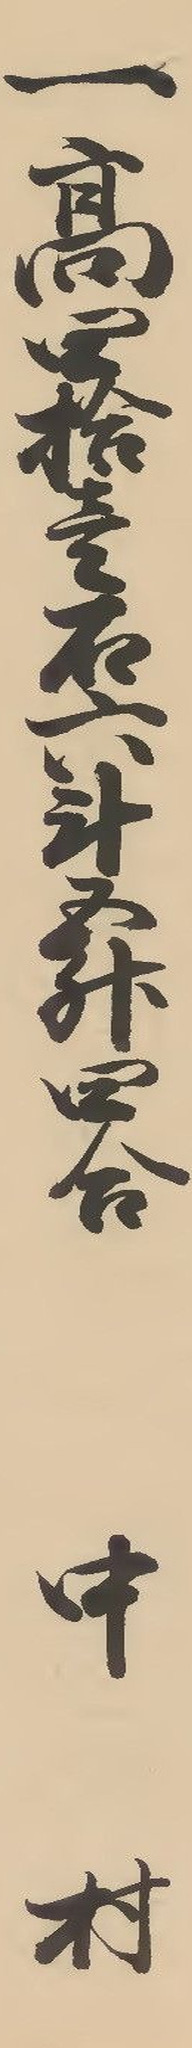一高四拾壱石六斗五升四合中村
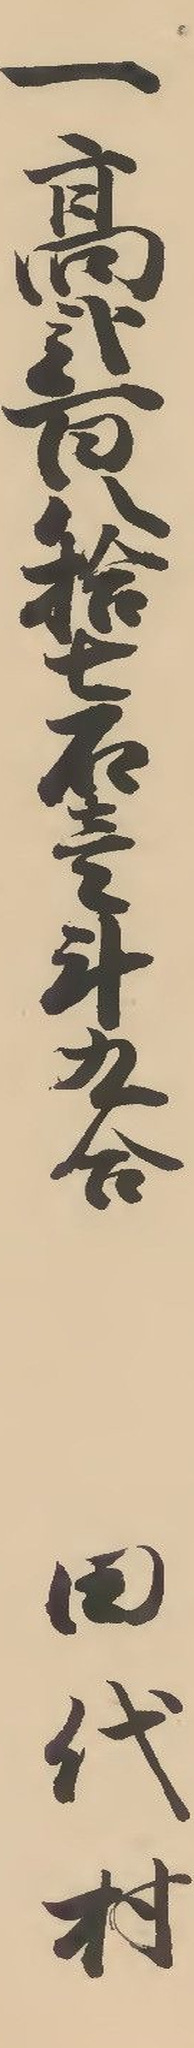一高弐百八拾七石壱斗九合田代村
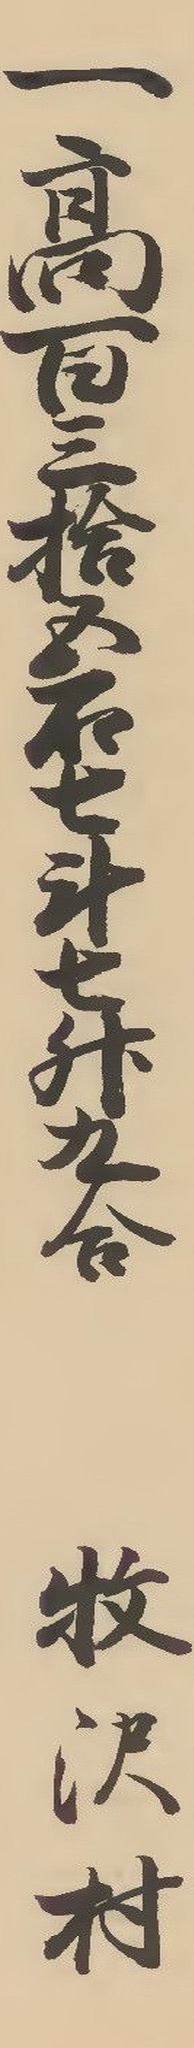一高百三拾五石七斗七升九合牧沢村
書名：陸奥国郷帳　１
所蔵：国立公文書館 National Archives of Japan
